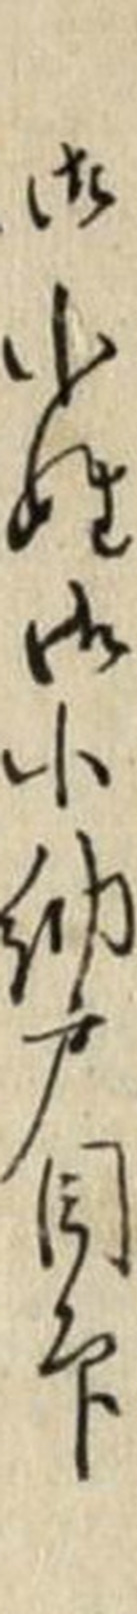御小姓御小納戸目印
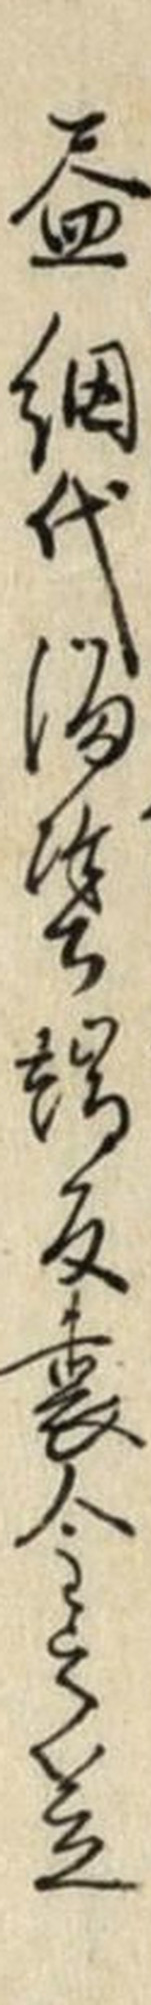昼網代溜塗端反裏金之笠
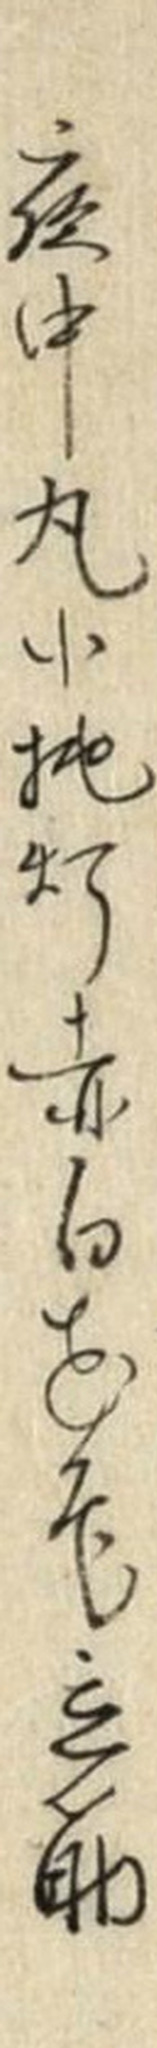夜中丸小挑灯赤白花色立筋
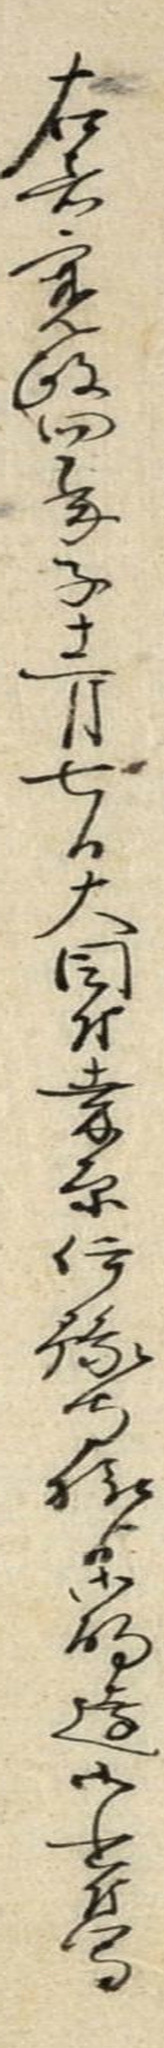右は寬政四年子十二月七日大目付桑原伊豫守様ゟ御触達御書付写

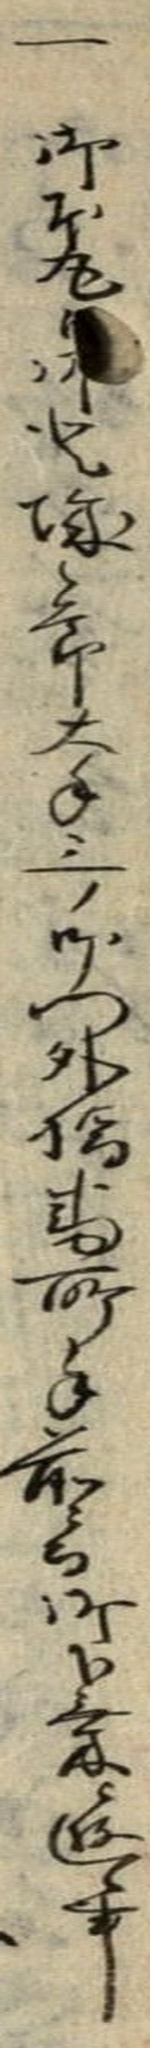一御本丸御登城之節大手三の御門外橋番所手前にて御下乗被遊候事
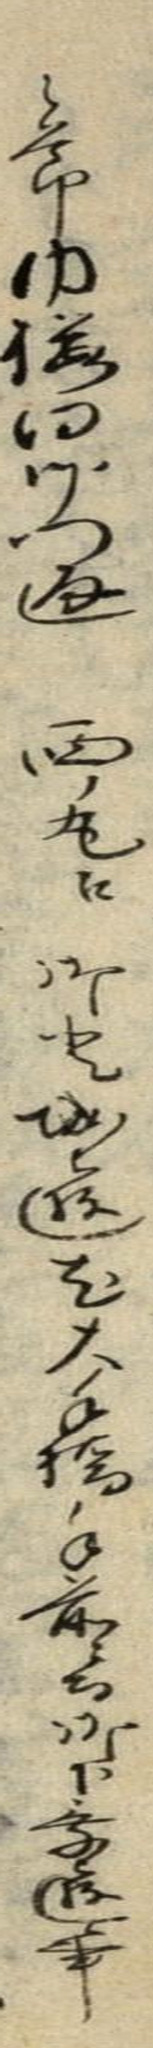之節内桜田御門通西の丸江御登城被遊尤大手橋手前にて御下乗被遊候事
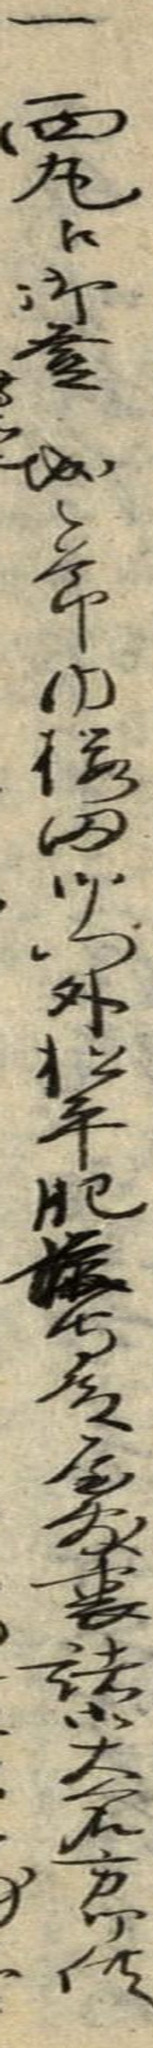一西丸江御登城之節内桜田御門外松平肥前守殿屋敷裏諸御大名方御供
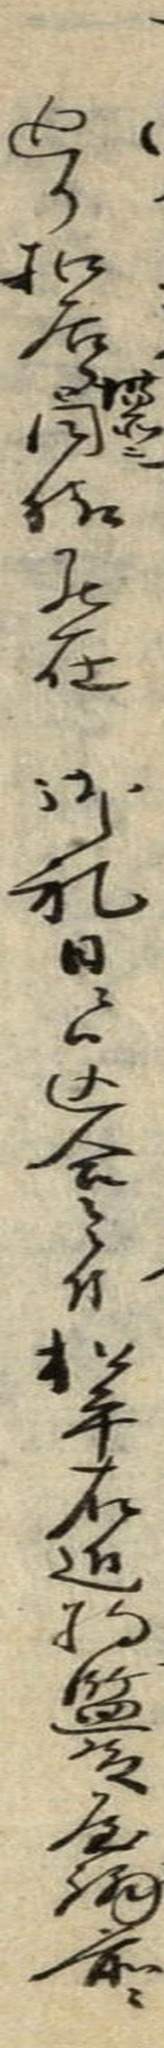廻り扣居候「場所に」同様罷在御礼日には込合候に付松平右近将監殿屋鋪前に
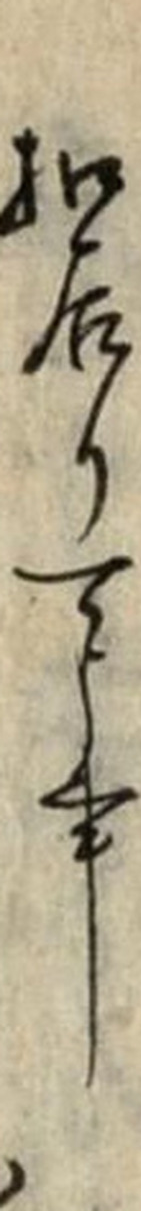扣居り可申事
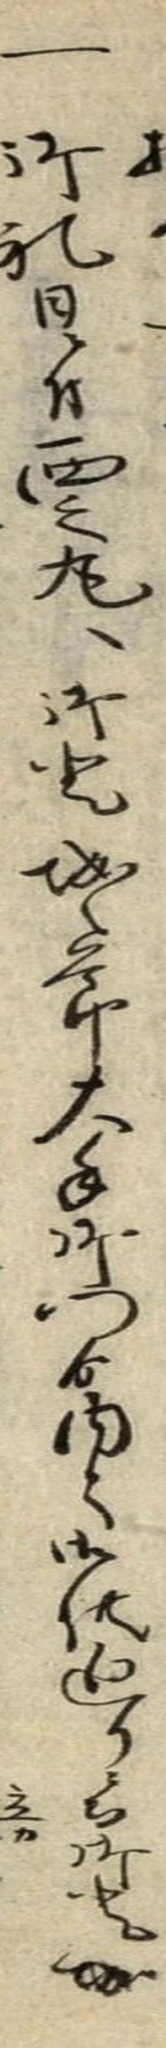一御礼日に付西之丸へ御登城之節大手御門ゟ内々御供廻りにて御登城
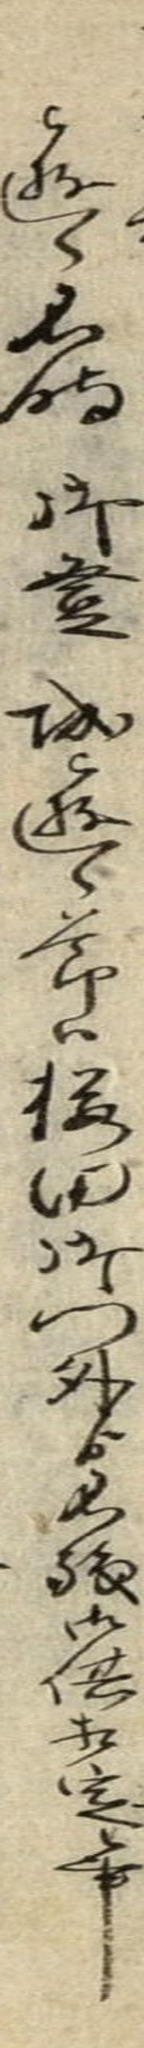被遊候不時御登城被遊候節は桜田御門外ゟ不残御供相定候事
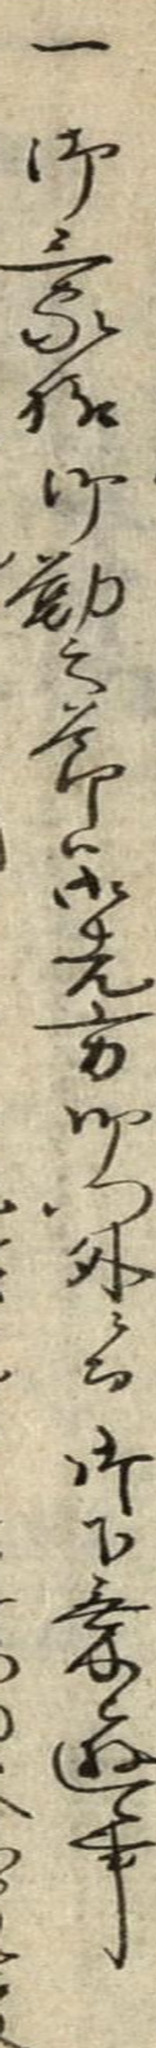一御三家様御勤之節は御先方御門外にて御下乗被遊候事
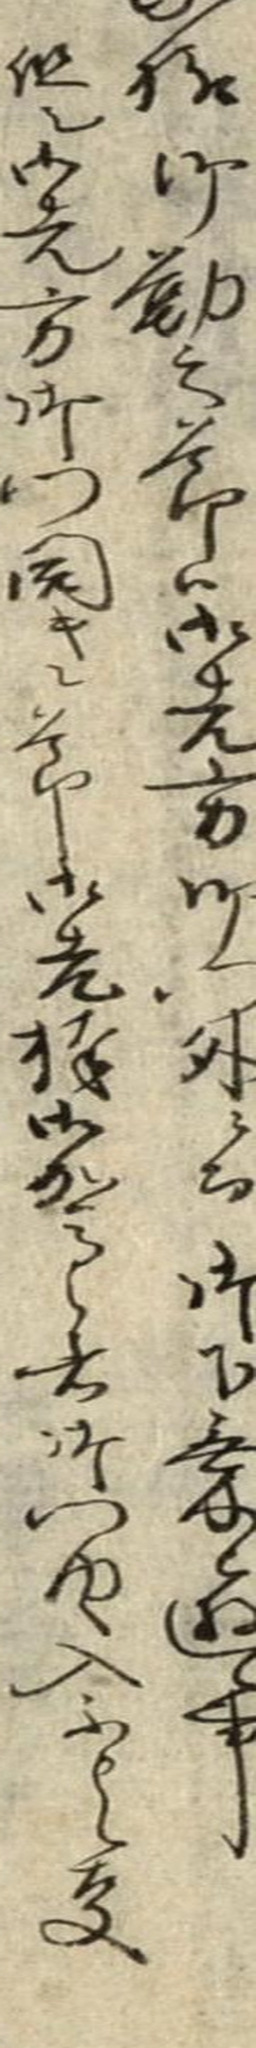但し御先方御門開き候節御先棒御駕之者御門内へ入不申候事
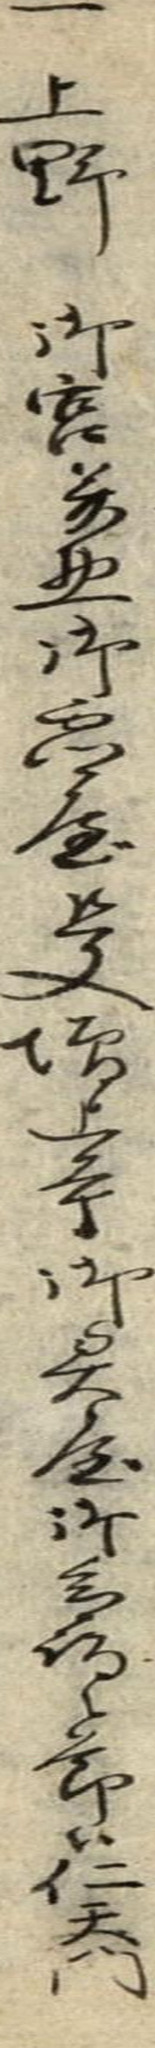一上野御宮并惣御霊屋且又増上寺御霊屋御参詣之節は仁王門
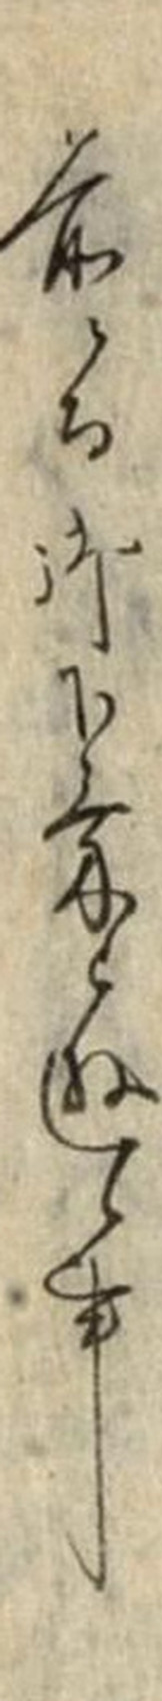前にて御下乗被遊候事
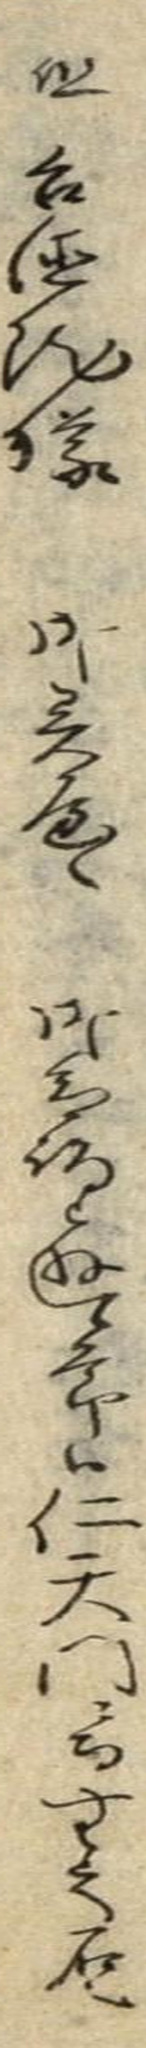但台徳院様御霊屋へ御参詣被遊候節は仁王門にて無之右之
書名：三都并道中之部
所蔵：福井県文書館 Fukui Prefectural Archives
